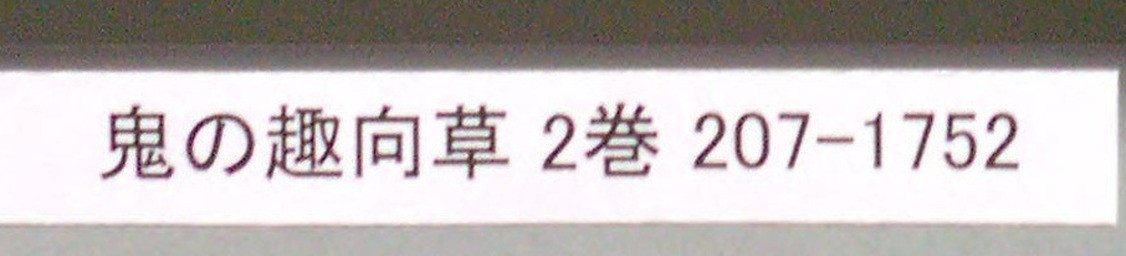鬼の趣向草下
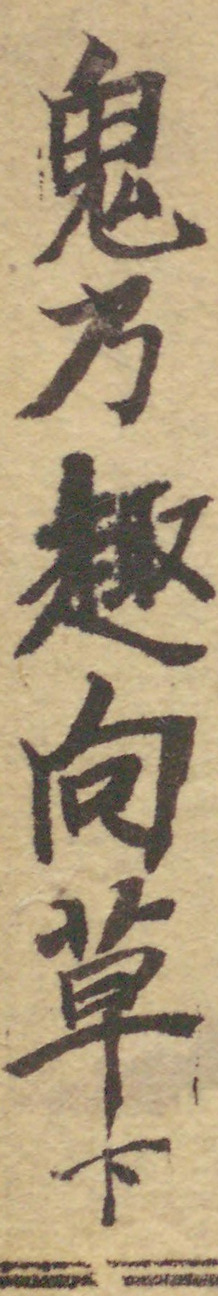鬼の趣向草下

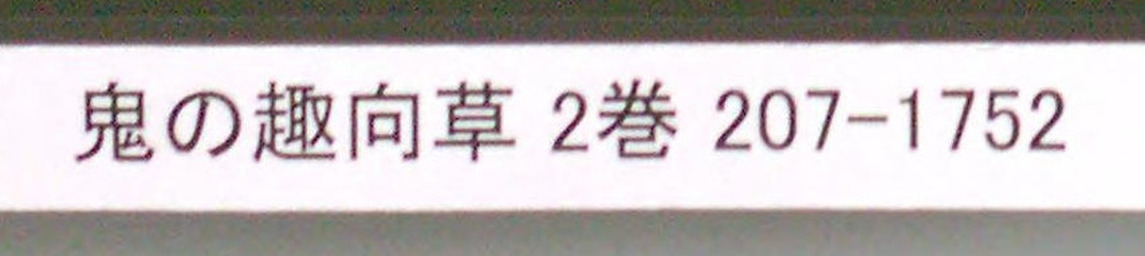鬼の趣向草下
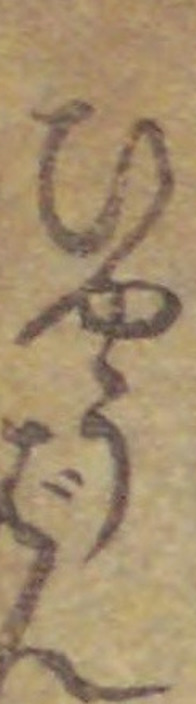ひやうばん

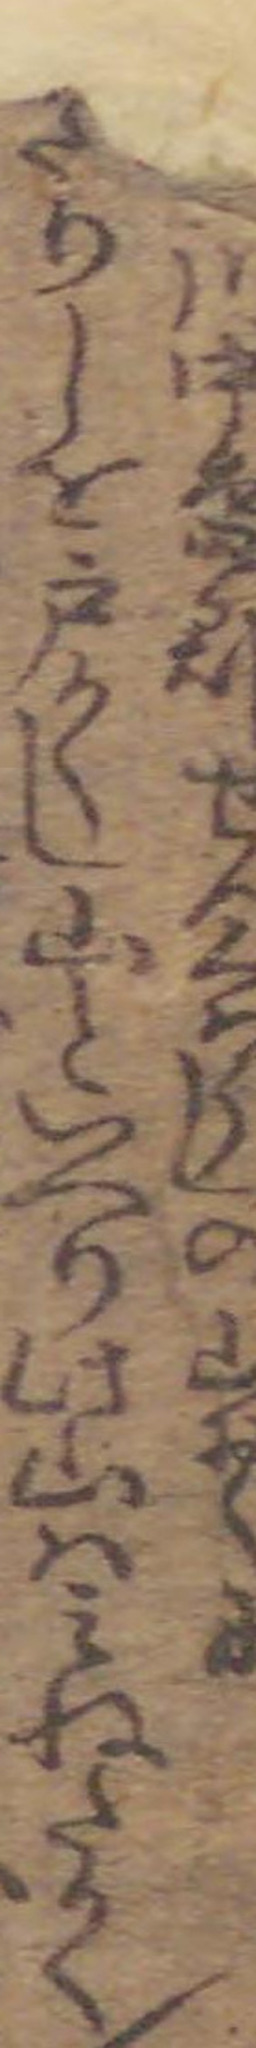たりしを戸かくし山といへり此山はみねたかく
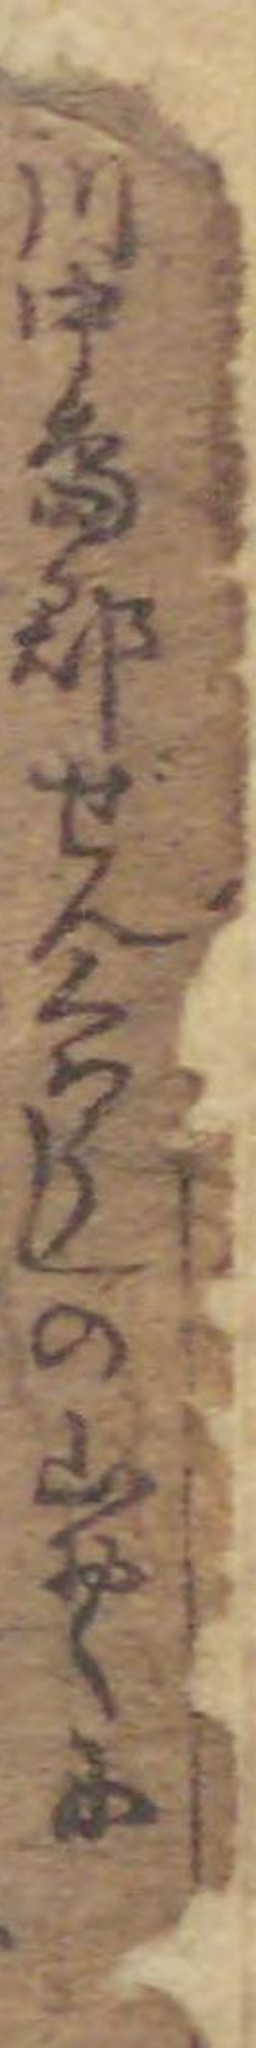川中島郡せんくわうしの山おくに
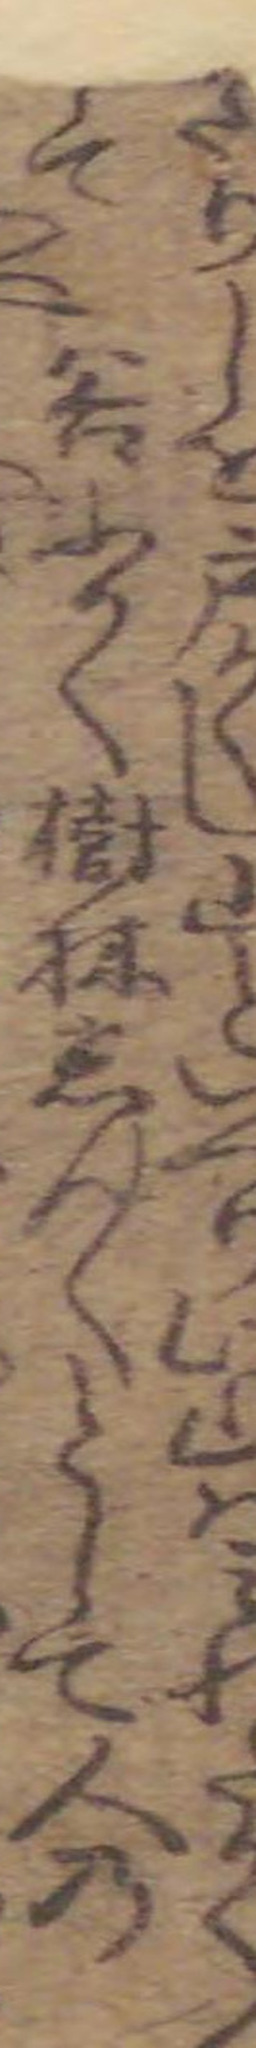して谷ふかく樹林しん〳〵として人の
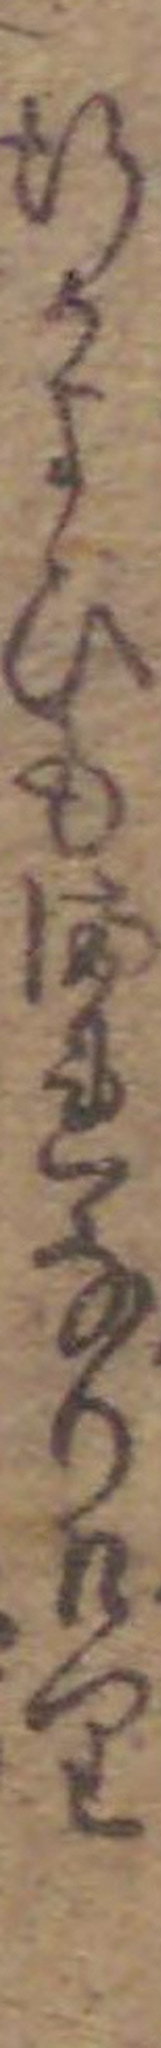行かよひもまれなりけり
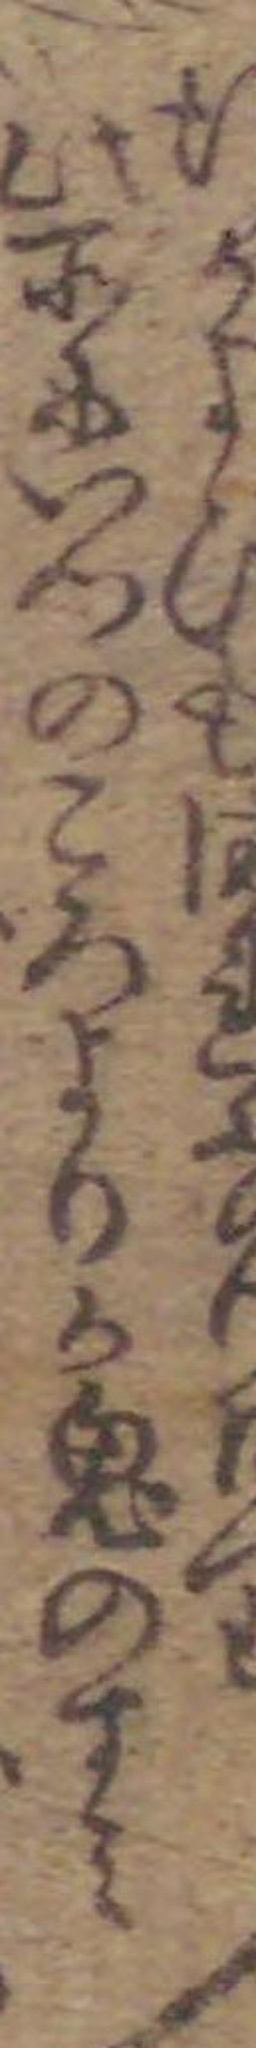此所にいつのころよりか鬼のすみ
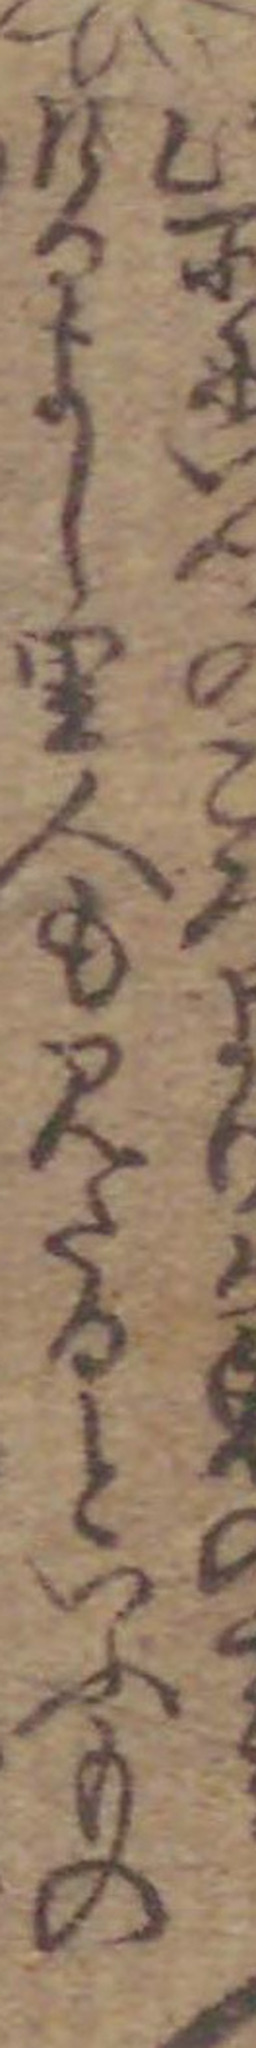けるよし里人も見たるといふもの
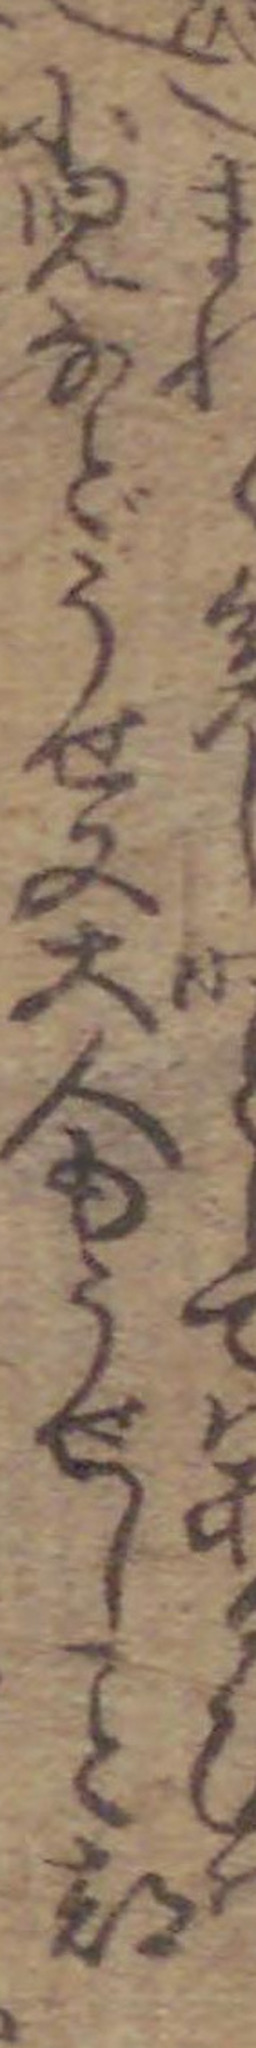小児などうせ又大人もうせしこと都
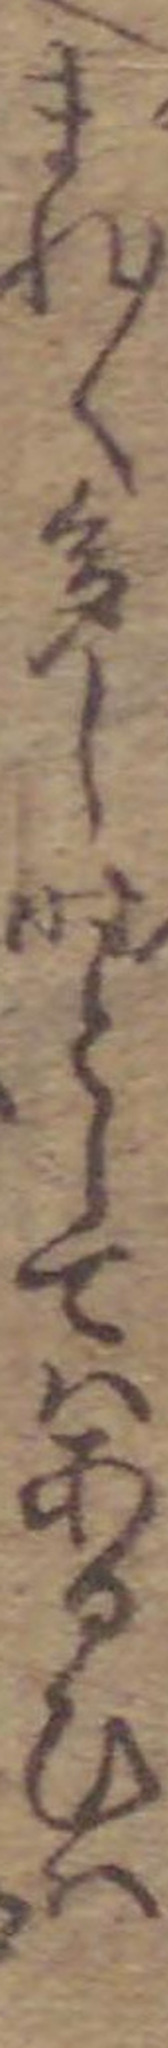まれ〳〵多し時としてはあるひは
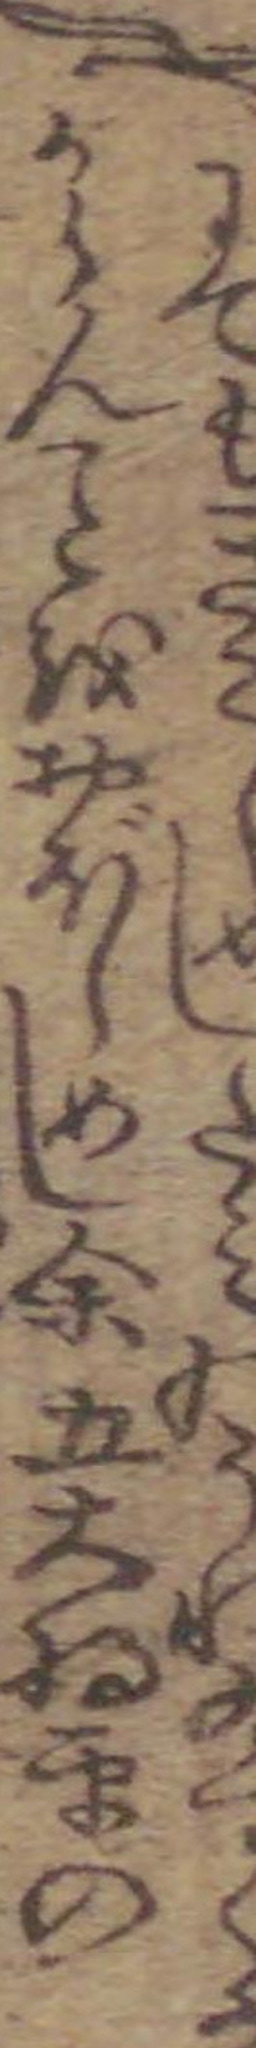からんことをおぼしめし余五大将平の
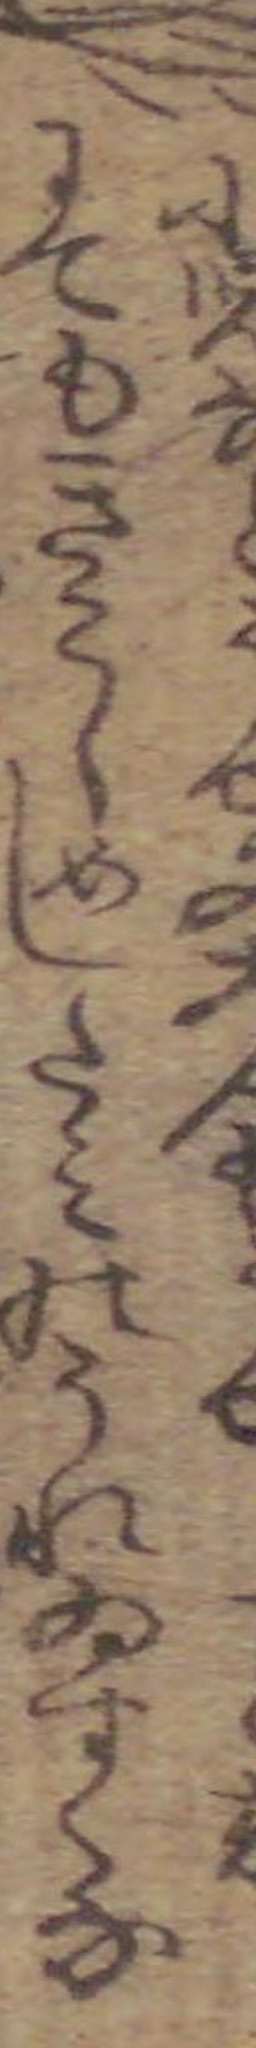にてもきこしめしたみのうれゐすくな
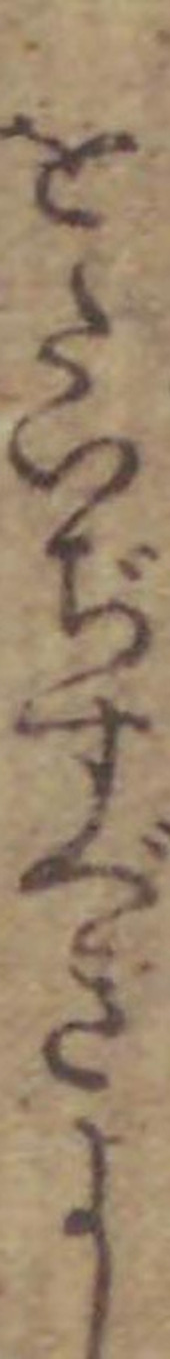をたいぢすべきよし
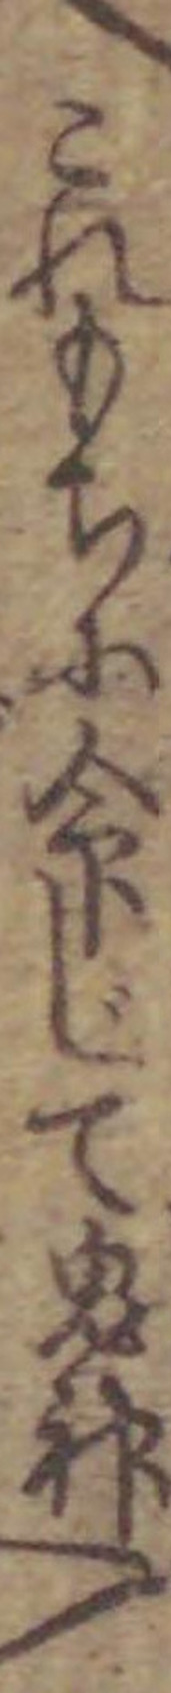これもちに命じて鬼神
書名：鬼の趣向草 2巻
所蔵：国立国会図書館 National Diet Library, JAPAN
